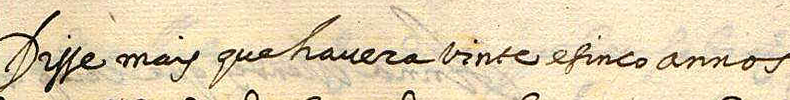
Disse mais que hauera vinte e sinco annos
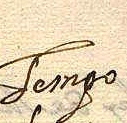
Tempo
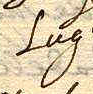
Lug
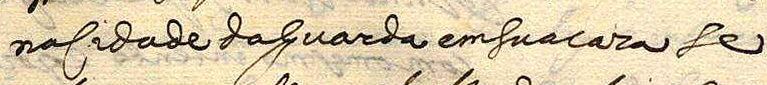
na Cidade da Guarda em sua caza se
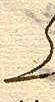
L
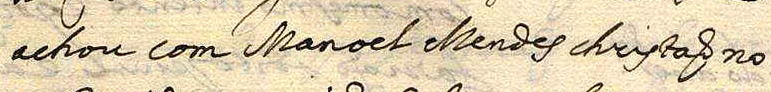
achou com Manoel Mendes christaõ no
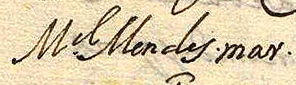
M.el Mendes mar.
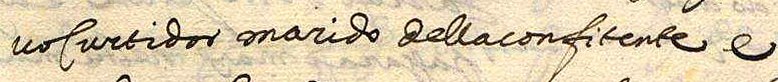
uo Curtidor marido della confitente e
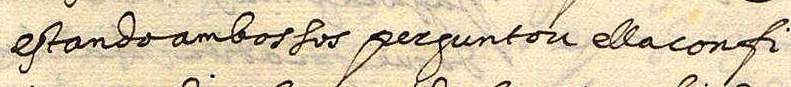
estando ambos sos perguntou ella confi
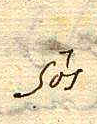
Sós
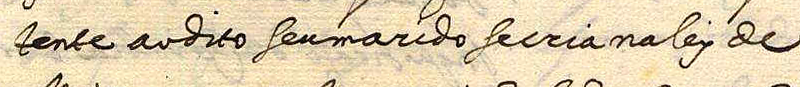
tente ao dito seu marido se cria na ley de
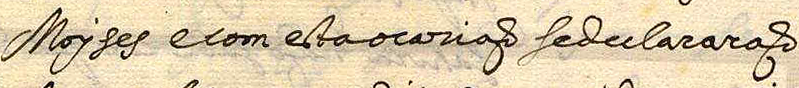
Moyses e com esta ocaziaõ se declararaõ
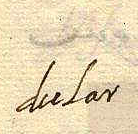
declar
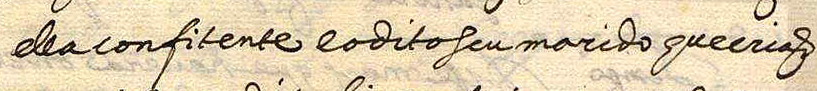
ella confitente e o dito seu marido que criaõ
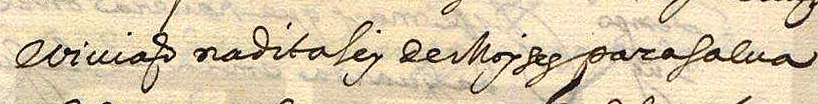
e viuiaõ na dita ley de Moyses para salua
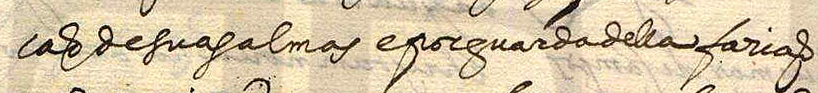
çaõ de suas almas e por guarda della faziaõ
